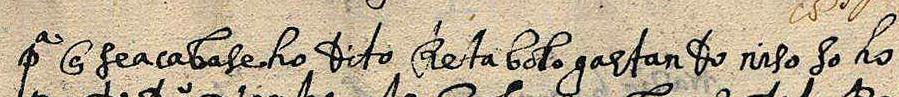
pa q̄ se acabase ho Dito Retabolo gastanDo niso so ho
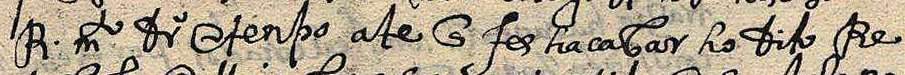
R. mto Dro e tenpo ate q̄ fes hacabar ho Dito Re
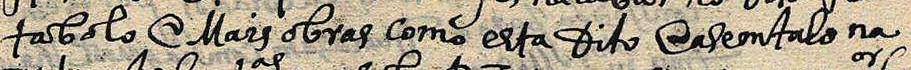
tabolo e Mais obras como esta Dito e asemtalo na
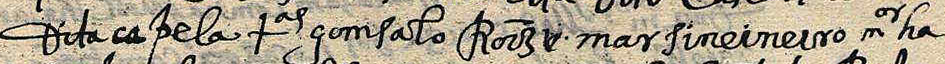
Dita capela tas gomsalo Roīz e marsineineiro mor ha
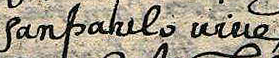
san paulo uiue
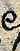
e
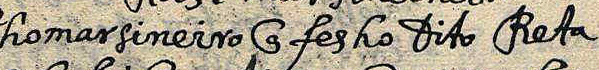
ho marsineiro q̄ fes ho Dito Reta
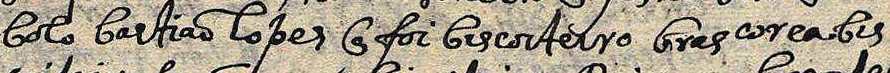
bolo bastião lopes q̄ foi bescoiteiro bras corcabis
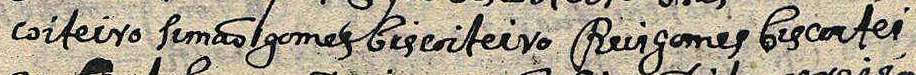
coiteiro Simão gomes biscorteiro Rui gomes biscoitei
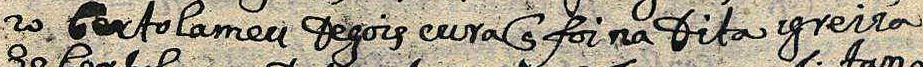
ro bertolameu De gois cura q̄ foi na Dita igreiia
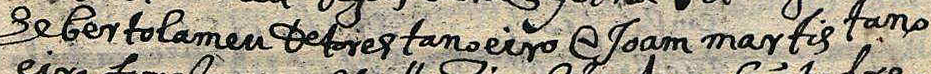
he bertolameu De tores tanoeiro e Joam martis tano
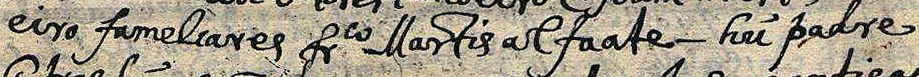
eiro fameliares frco Martis algaate hū padre
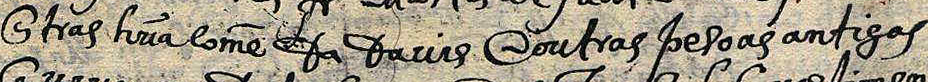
q̄ tras hūa comēDa Dauis e outras pesoas antigas
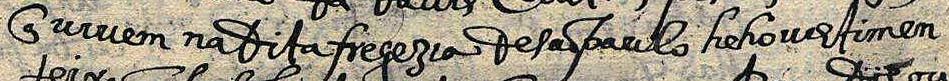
q̄ uiuem na Dita fregezia De saõ paulo he ho uestimen
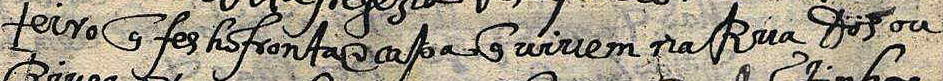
teiro q̄ fes ho fronta e capa q̄ uiuem na Rua Dos ou
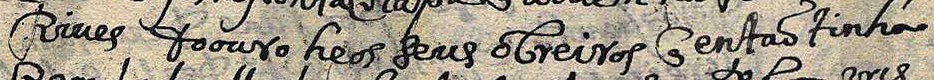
Riues Do ouro he os seus obreiros q̄ entaõ tinha
